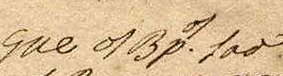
que os Bp.os saõ
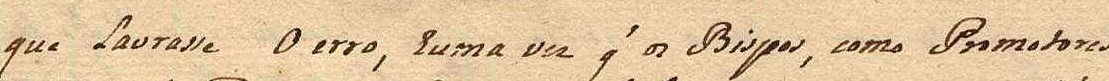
que Lavrasse O erro, huma vez q̄ os Bispos, como Promotores
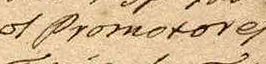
os Promotores
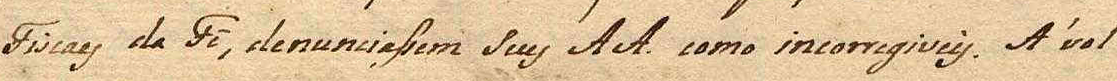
Fiscaes da Fé, denunciassem seus AA. como incorregiveis. Á vol
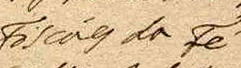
Fiscáes da Fé
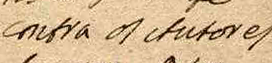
contra os Autores
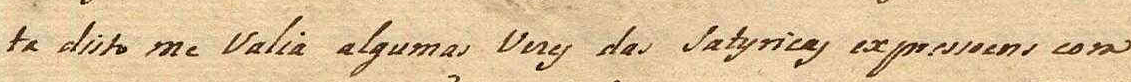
ta disto me valia algumas vezes das satyricas expressoens com
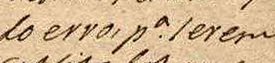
do erro, p.a serem
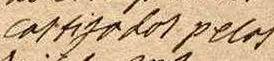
castigados pelas
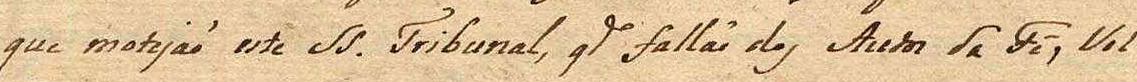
que motejaõ este SS. Tribunal, qd.o fallaõ dos Autos da Fé, Vol
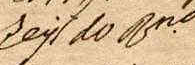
Leys do Rn.o
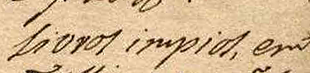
Livros impios, em
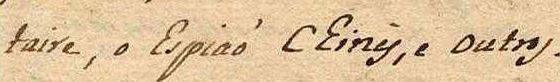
taire, o Espiaõ chines, e outros.
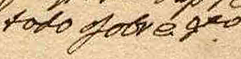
todo o sobred.to
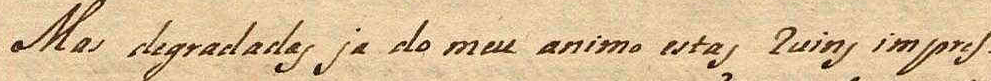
Mas degradadas ja do meu animo estas Ruins impres
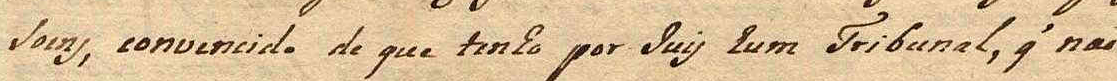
soens, convencido de que tenho por Iuis hum Tribunal, q̄ naõ
